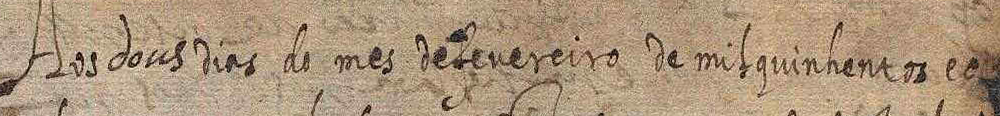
Aos dous dias do mes de feuereiro de mil quinhentos e oiten
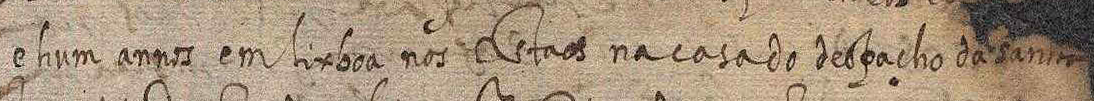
e hum annos em lixboa nos estaos na casa do despacho da sancta
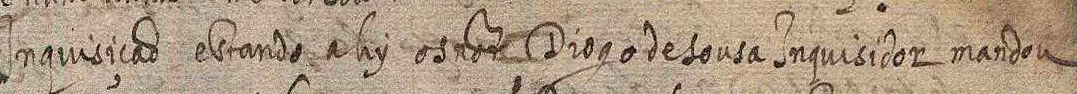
Jnquisiçaõ estando ahy o snōr Diogo de sousa Jnquisidor mandou
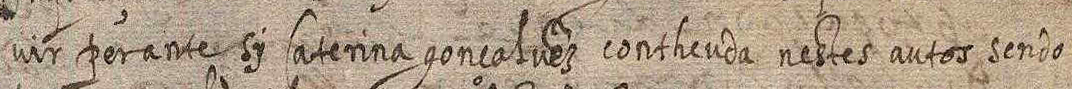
uir perante sy Caterina gonçaluēz contheuda nestes autos sendo
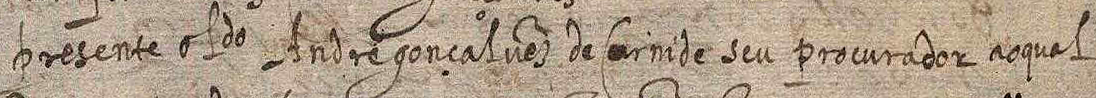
presente o Ldo Andre goncaluēz de Carnide seu procurador ao qual
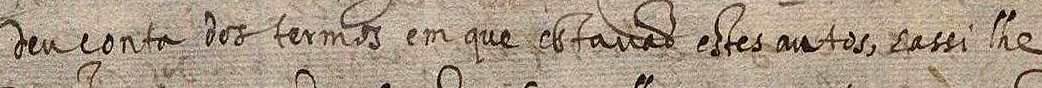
deu conta dos termos em que estauaõ estes autos, E assi lhe
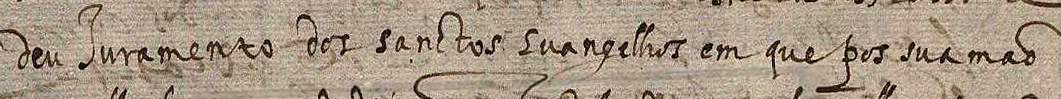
deu Juramento dos sanctos Euangelhos em que pos sua maõ
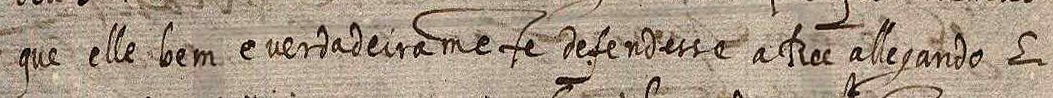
que elle bem e uerdadeiramēte defendesse a Ree allegando E
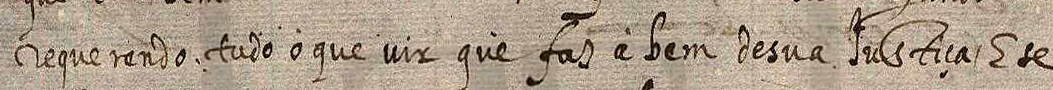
requerendo tudo o que uir que faz a bem de sua Justiça / E se
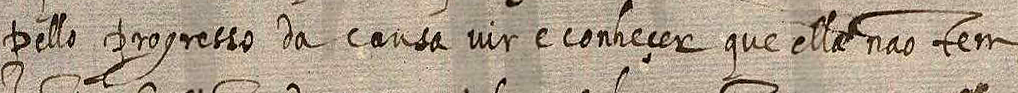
pello progresso da causa uir e conheçer que ella não tem
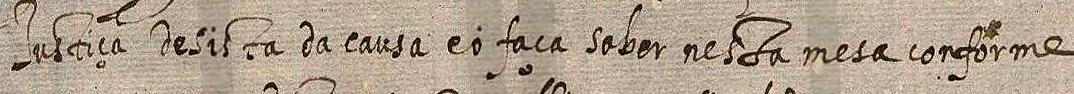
Justiça desista da causa e o faça saber nesta mesa conforme
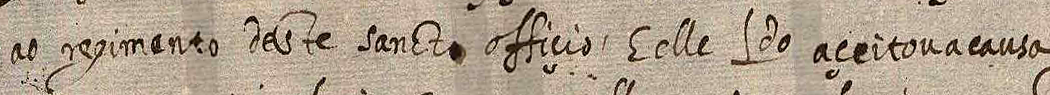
ao regimento deste sancto offiçio / E elle Ldo açeitou a causa
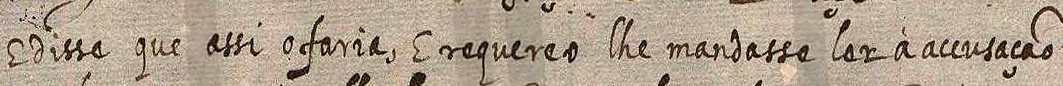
E disse que assi o faria, E requereo lhe mandasse ler a accusaçaõ
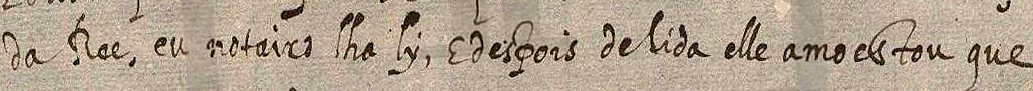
da Ree, eu notairo lha ly, E despois de lida elle amoestou que
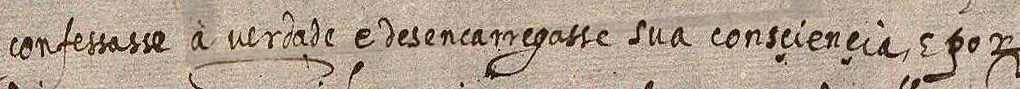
confessasse à uerdade e desencarregasse sua consçiençia, E por
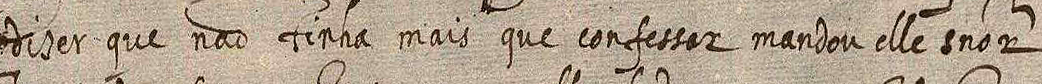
dizer que naõ tinha mais que confessar mandou elle snor̄
